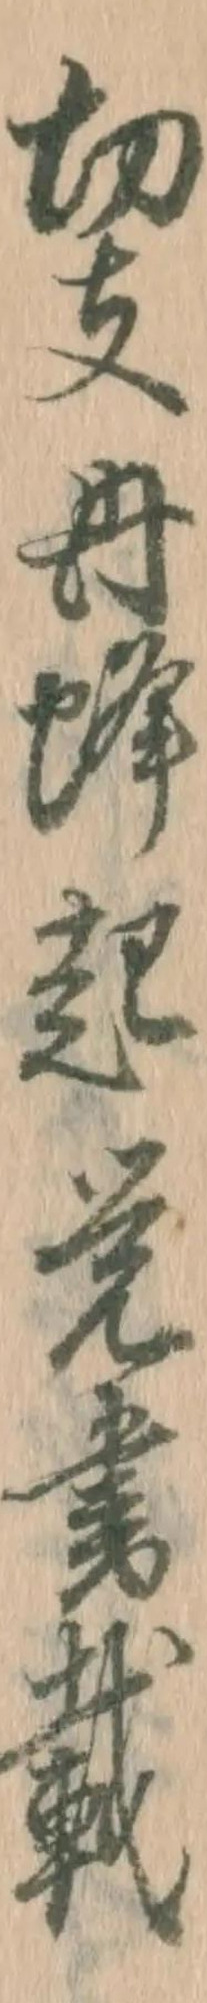切支丹蜂起覚書載
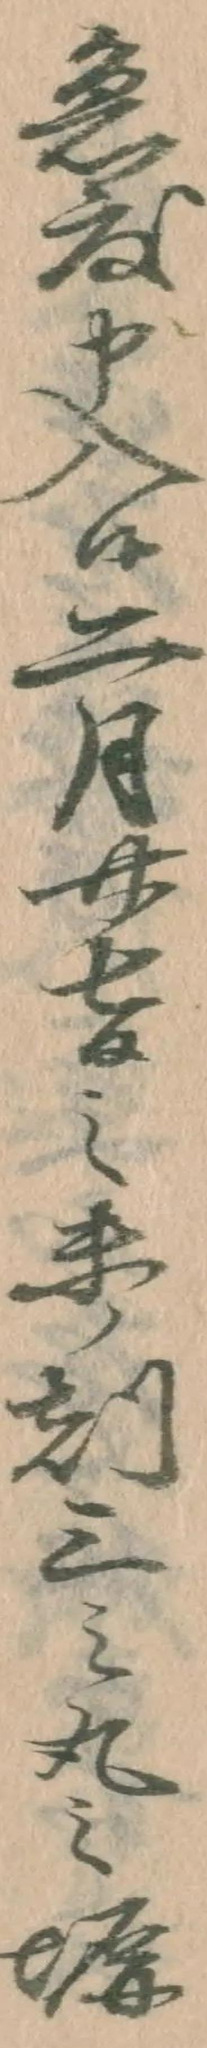急度申入候二月廿七日之未之刻三之丸之塀
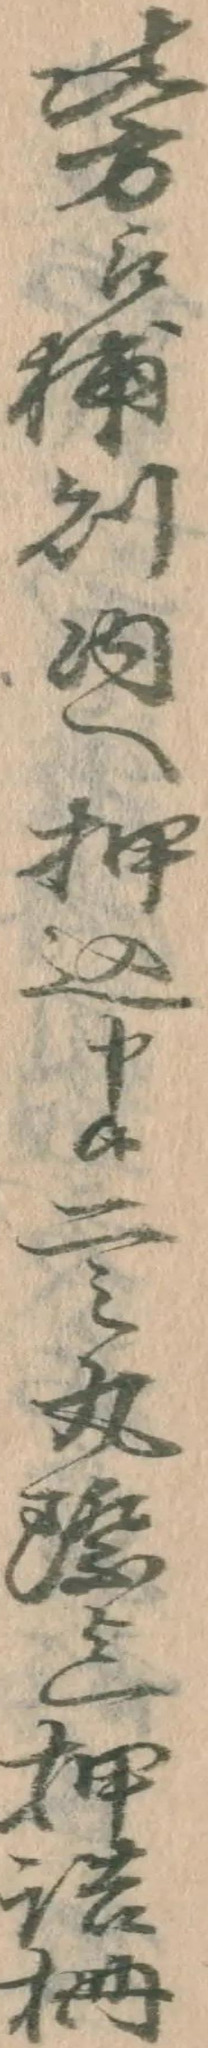此方江捕則内へ押込申候二之丸際迄押詰柵
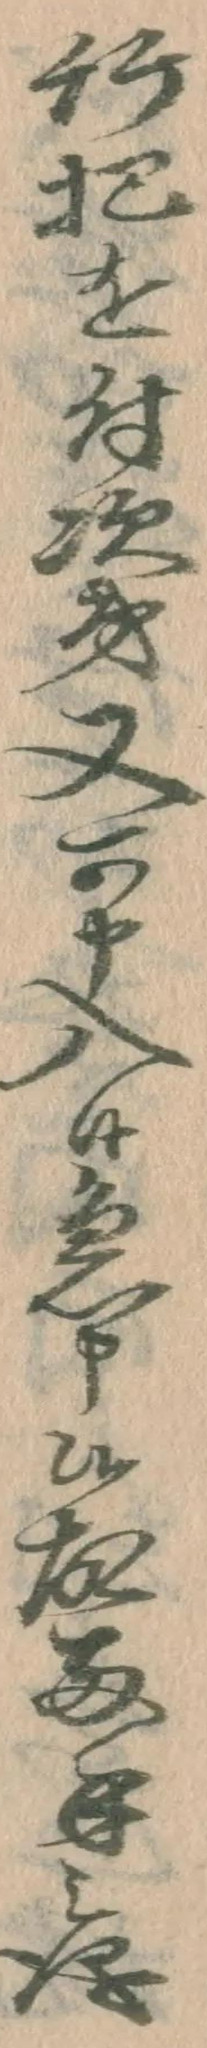竹把を付次第又可申入候急申候故両手之儀
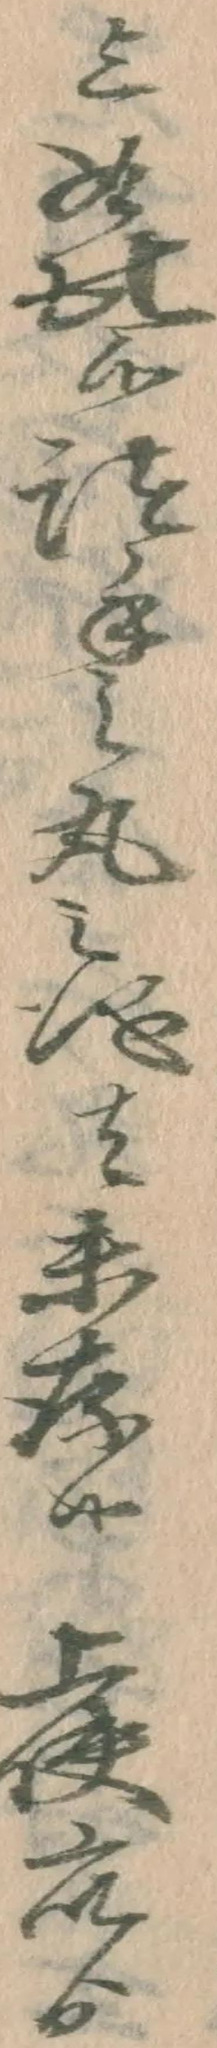与如此候諸手之丸之儀者未存候上使衆ゟ
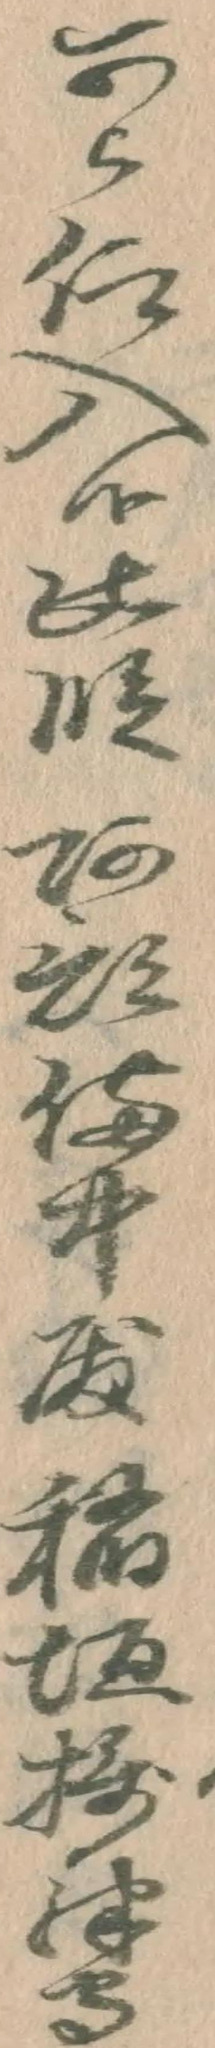可被仰入候此段阿部備中殿稲垣摂津守
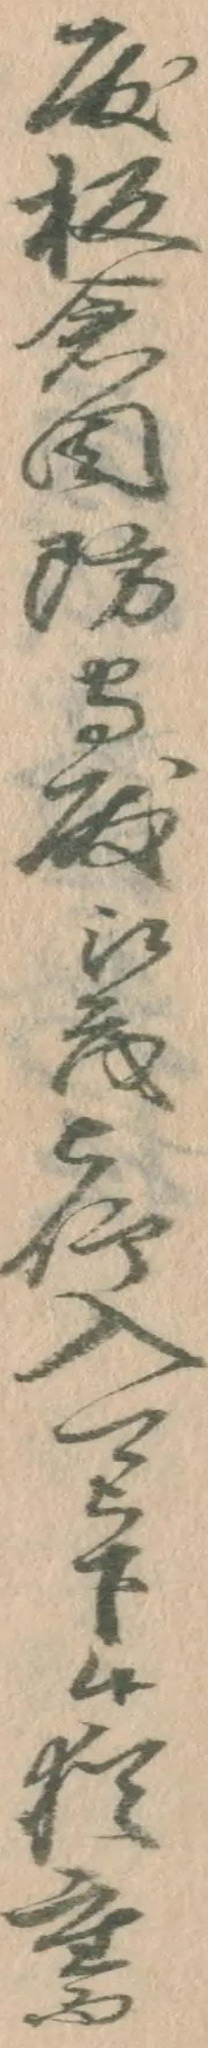殿板倉周防守殿江茂被仰入可被下候猶重而
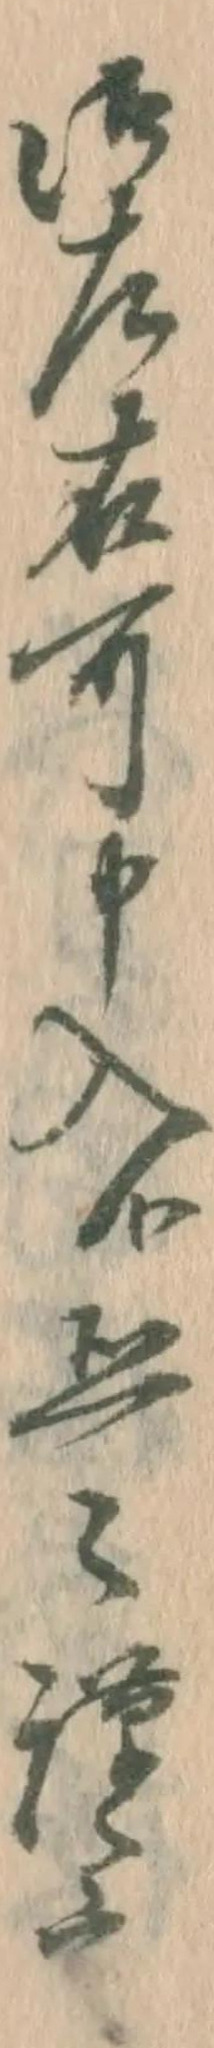御左右可申入候恐々謹言
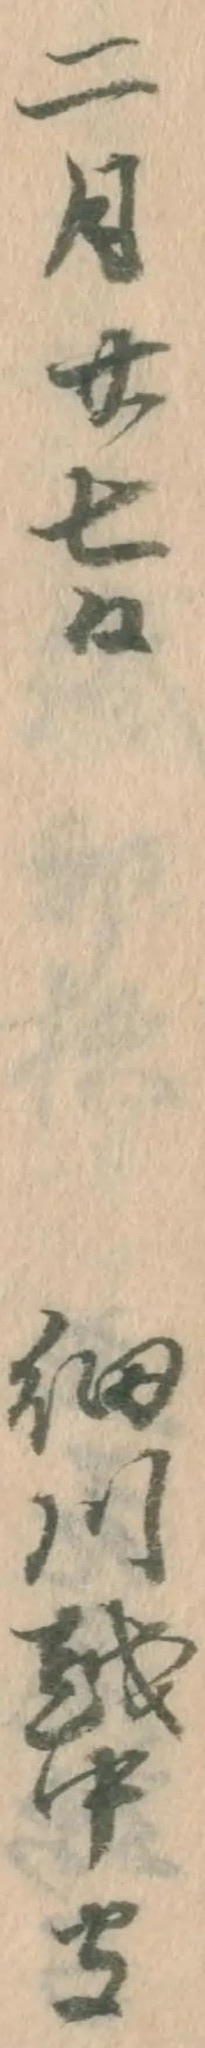二月廿七日細川越中守

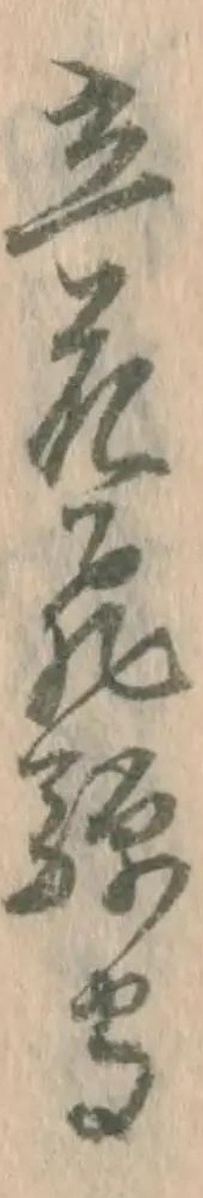立花飛騨守
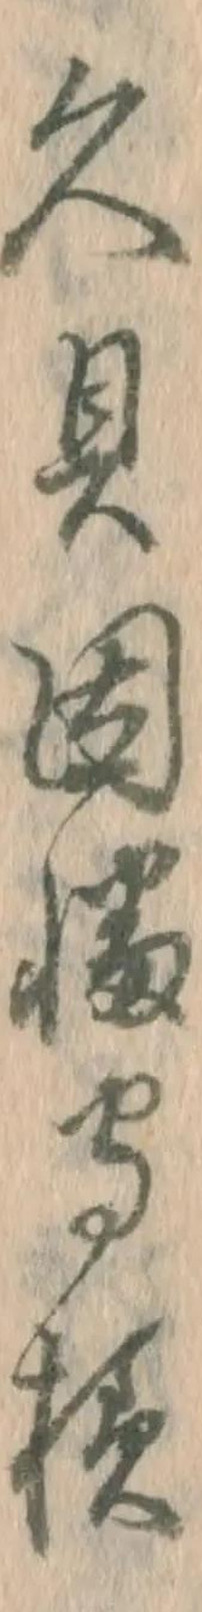久貝因幡守様
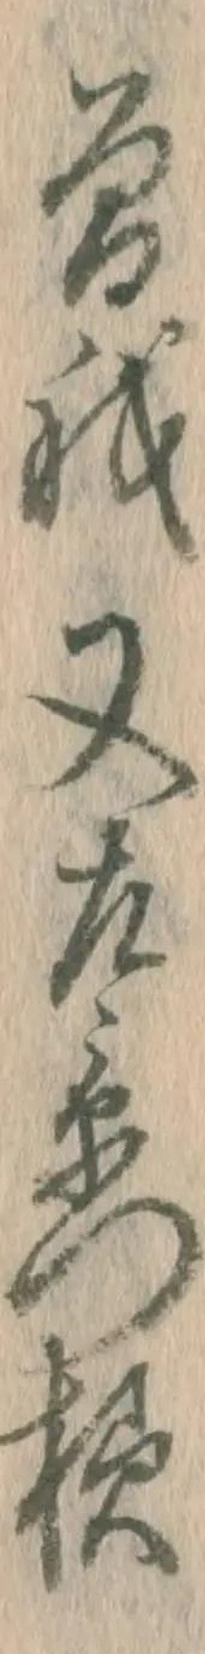曽我又左衛門様
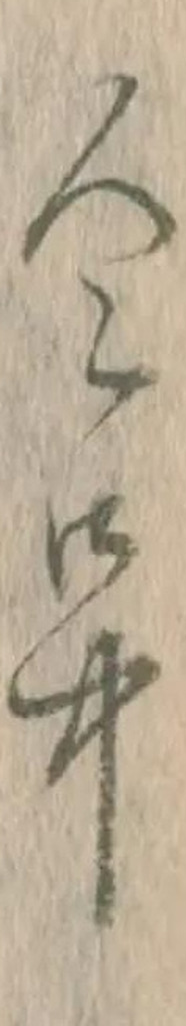人々御中
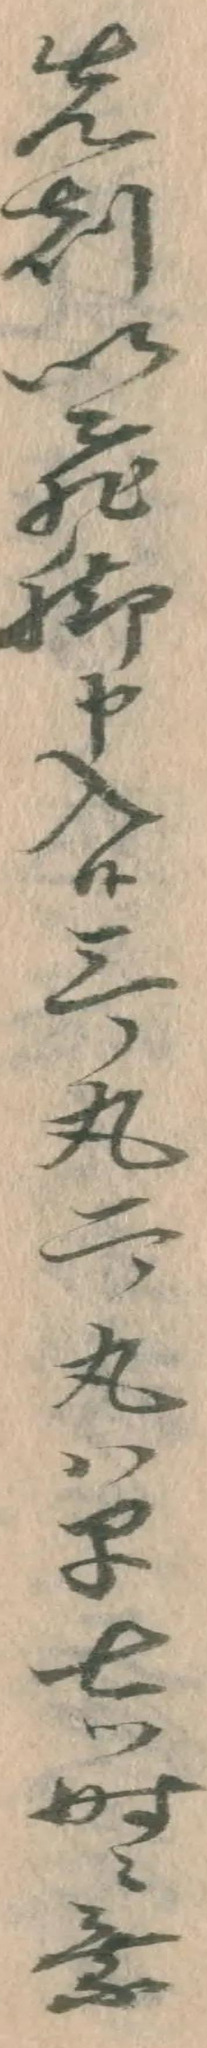先刻以飛脚申入候三之丸二之丸は早七つ時に乗
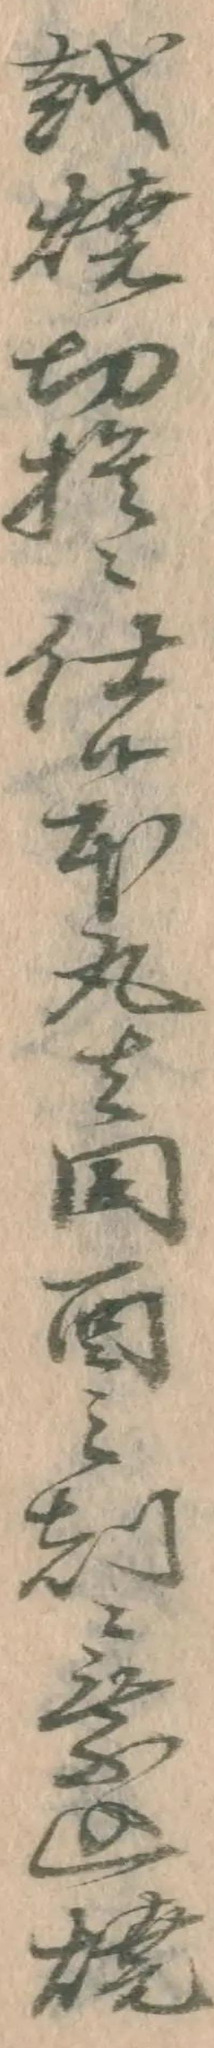越焼切捨に仕候本丸者同酉之刻に乗込焼
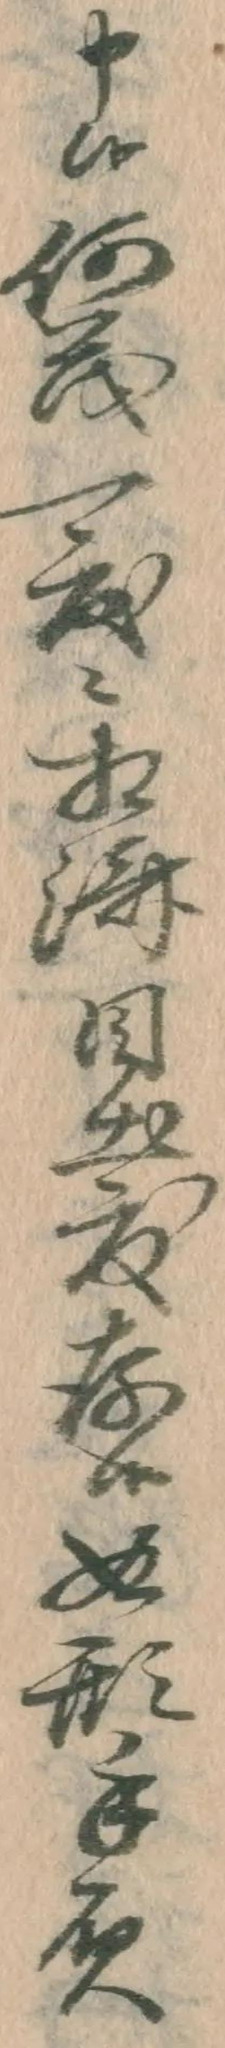申候何茂一度に相済目出度存候如形手負
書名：切支丹御退治記 49巻. [8]
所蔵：国立国会図書館 National Diet Library, JAPAN
